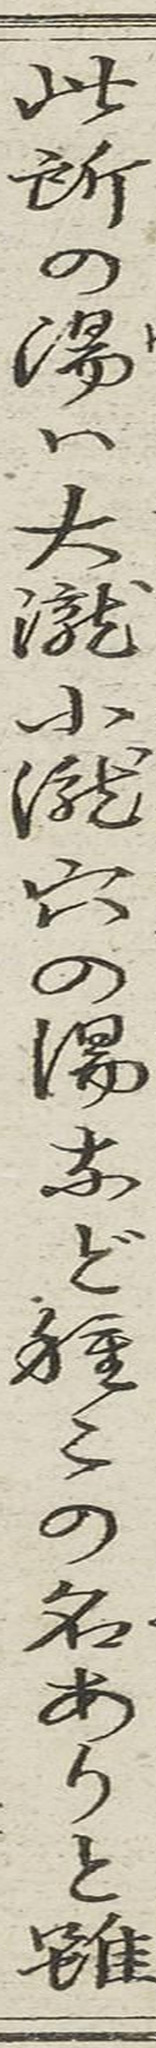此所の湯は大瀧小瀧穴の湯など種々の名ありと雖
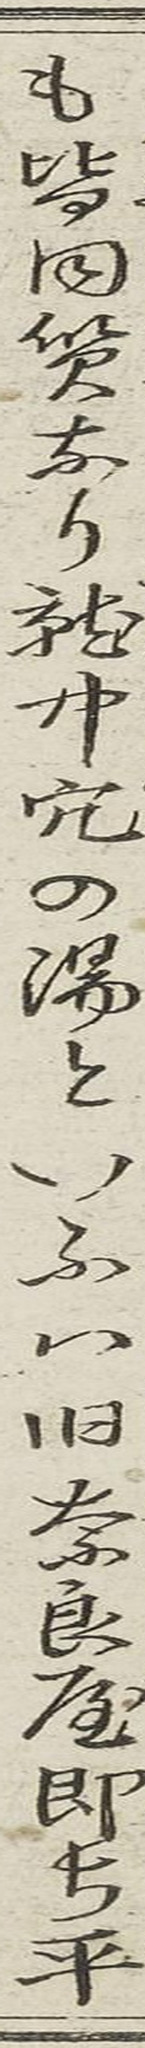も皆同質なり就中穴の湯といふは旧奈良屋即ち平
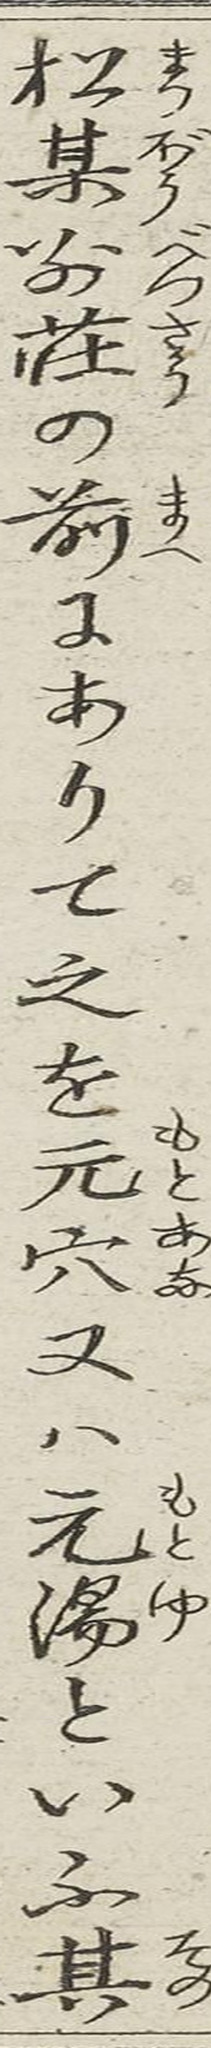松某別荘の前にありて之を元穴又は元湯といふ其
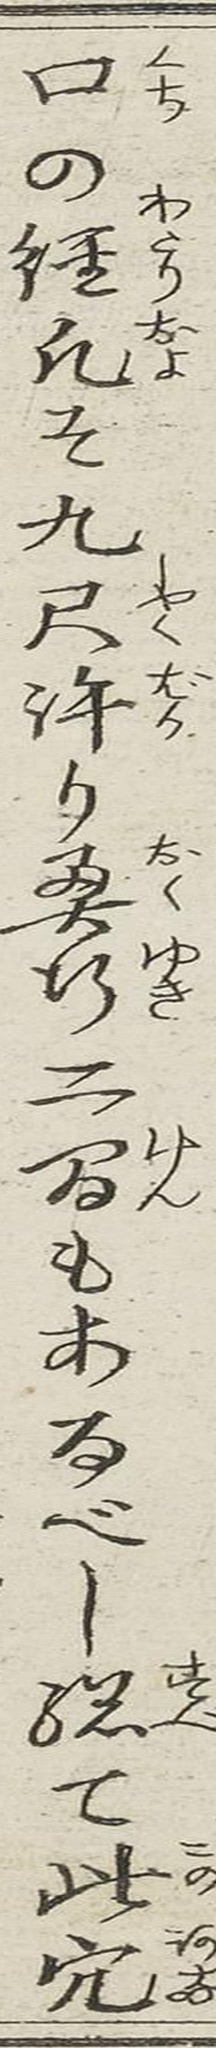口の経凡そ九尺許り奥行二間もあるべし総て此穴
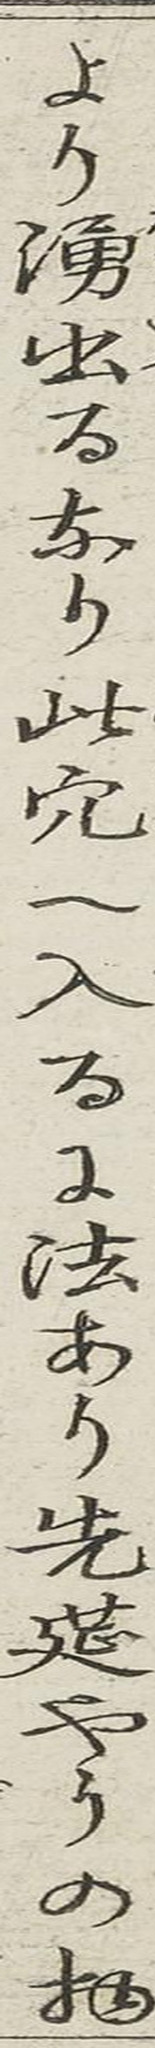より湧出るなり此穴へ入るに法あり先莚やうの物
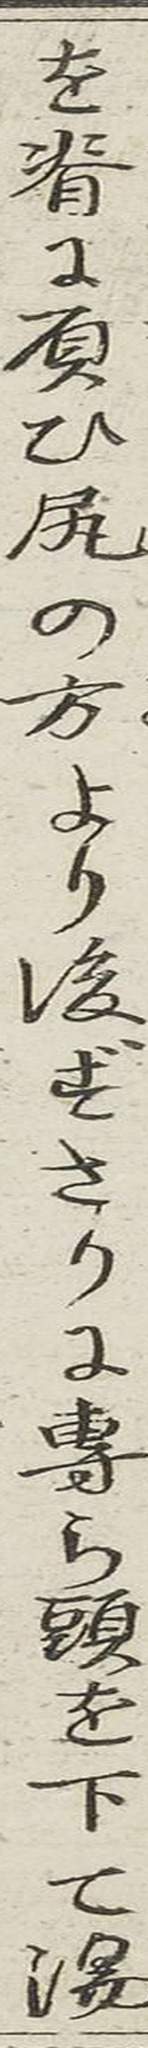を背に負ひ尻の方より後ずさりに専ら頭を下て湯
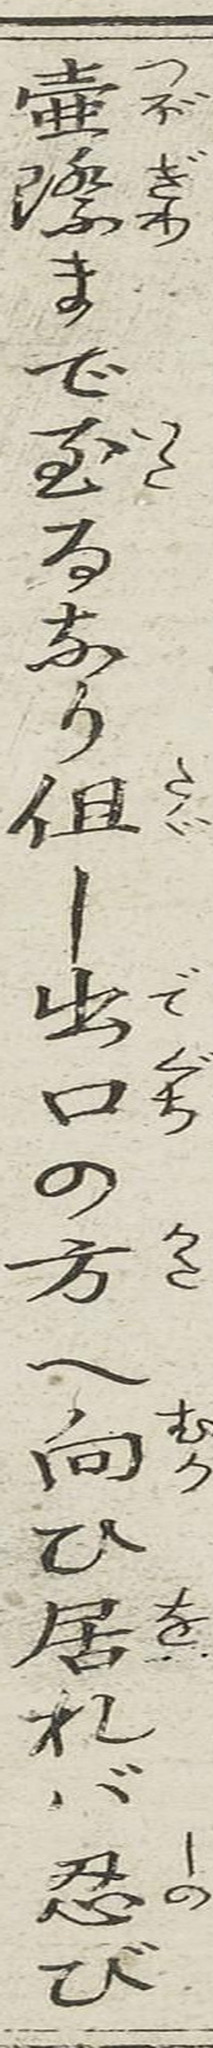壺際まで至るなり但し出口の方へ向ひ居れば忍び
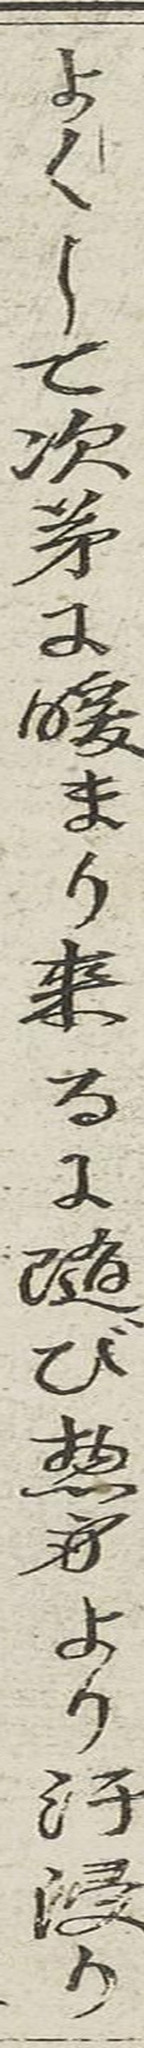よくして次第に暖まり来るに随び惣身より汗浸り
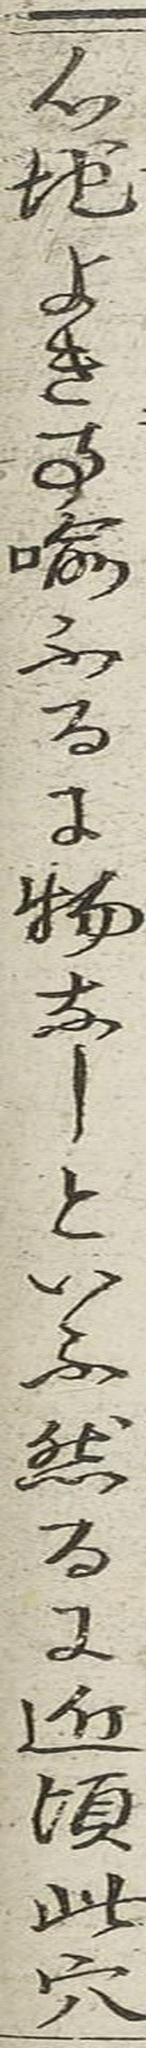心地よき事喩ふるに物なしといふ然るに近頃此穴
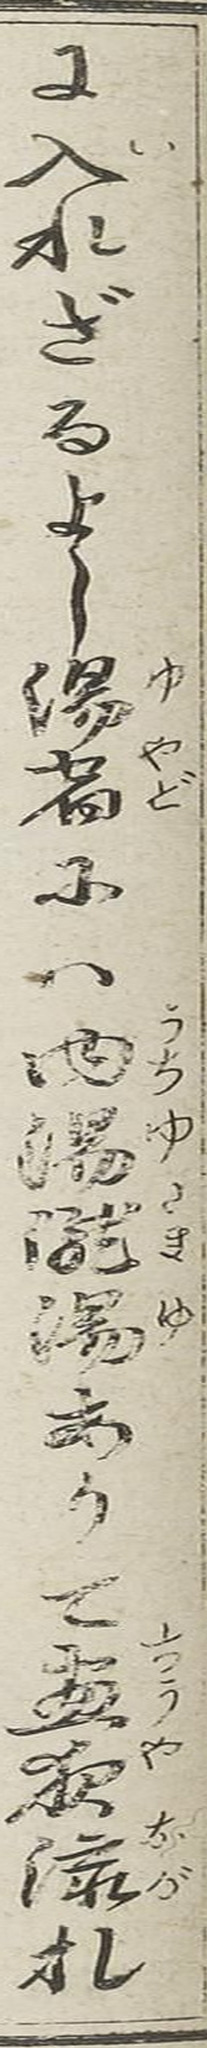に入れざるよし湯宿には内湯瀧湯ありて昼夜流れ
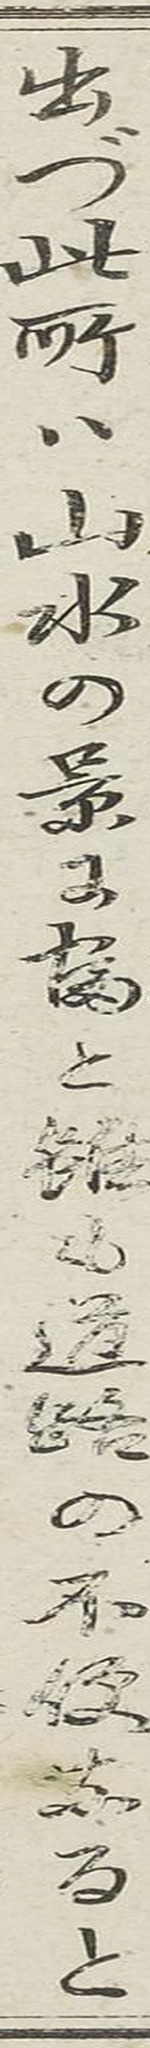出づ此所は山水の景に富と雖も道路の不便なると
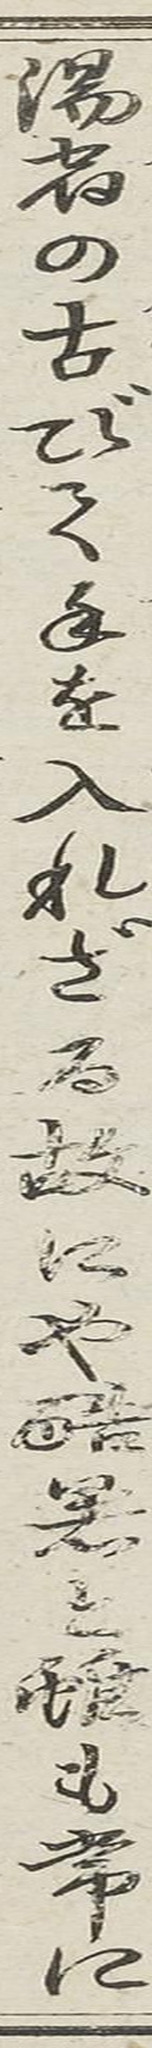湯宿の古びて手を入れざる故にや酷暑と雖も常に
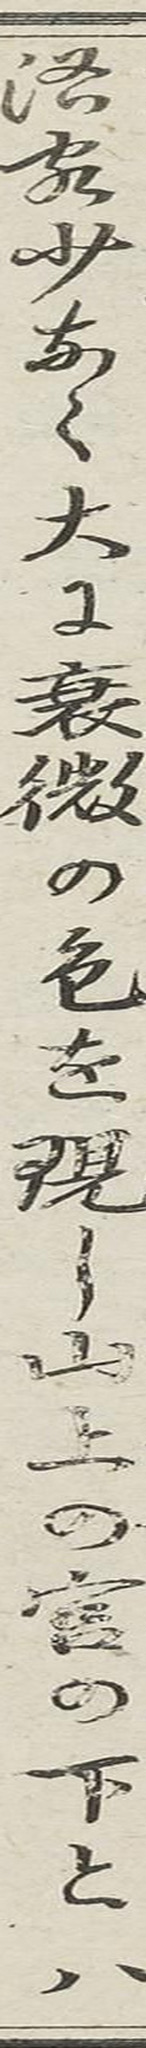浴客少なく大に衰微の色を現し山上の宮の下とは
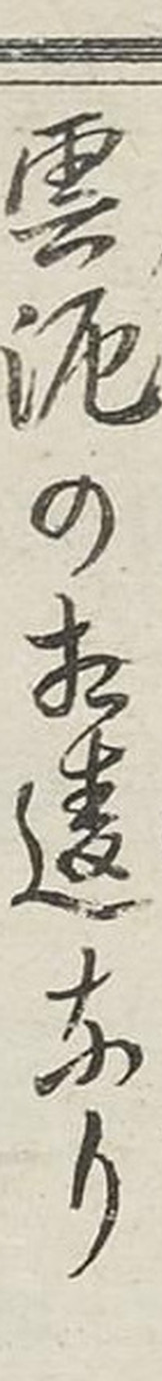雲泥の相違なり
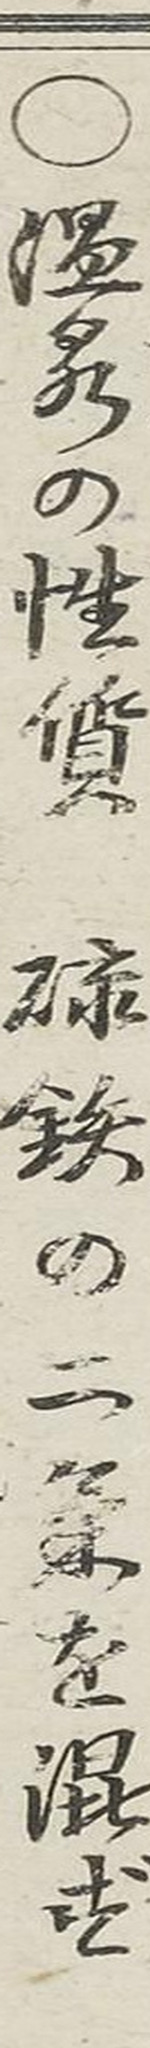〇温泉の性質硫鉄の二気を混ず
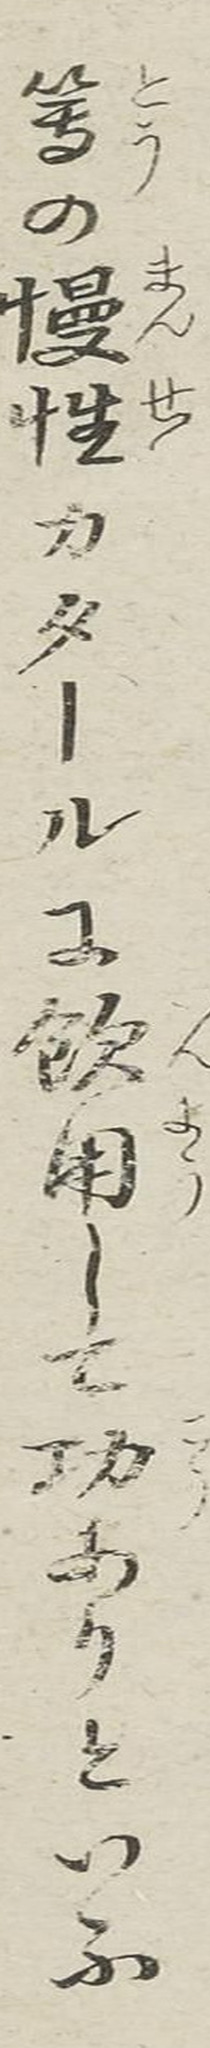等の慢性カタールに飲用して功ありといふ
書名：箱根温泉誌　全
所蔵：東京大学地震研究所図書室 Earthquake Research Institute Library, The University of Tokyo, JAPAN
